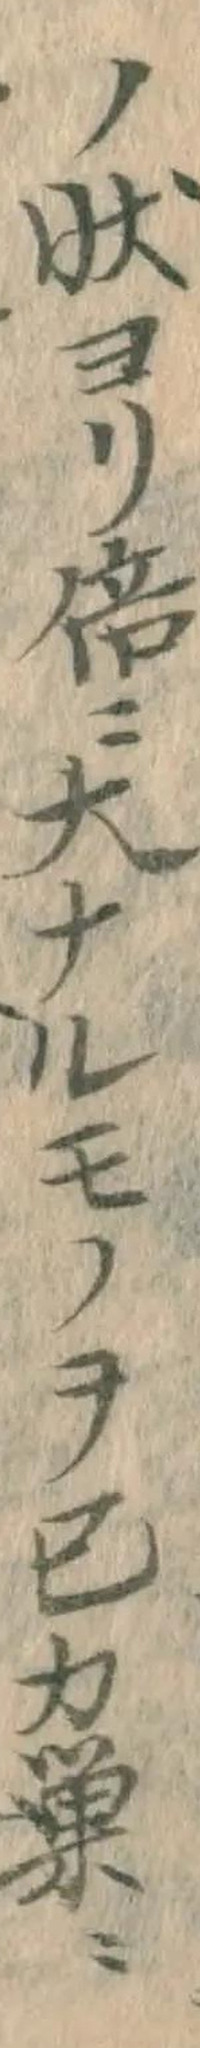ノ状ヨリ倍ニ大ナルモノヲ己カ巣ニ
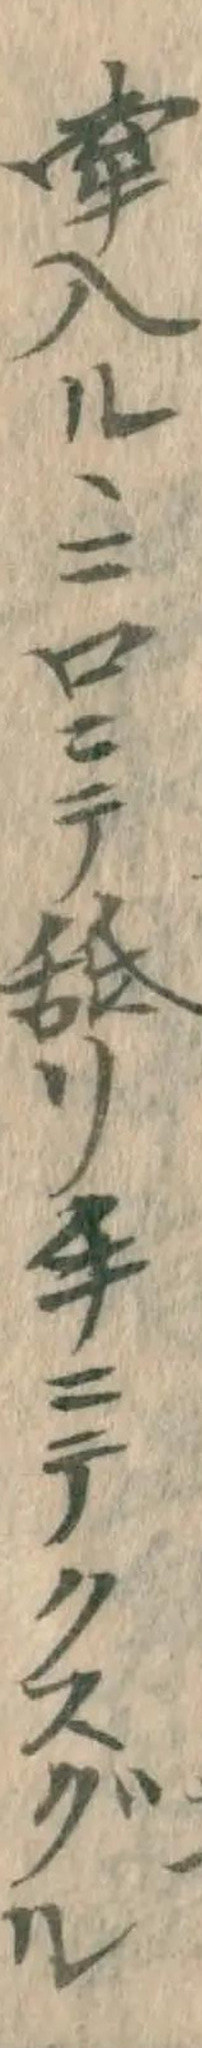牽入ルヽニ口ニテ舐リ手ニテクスグル
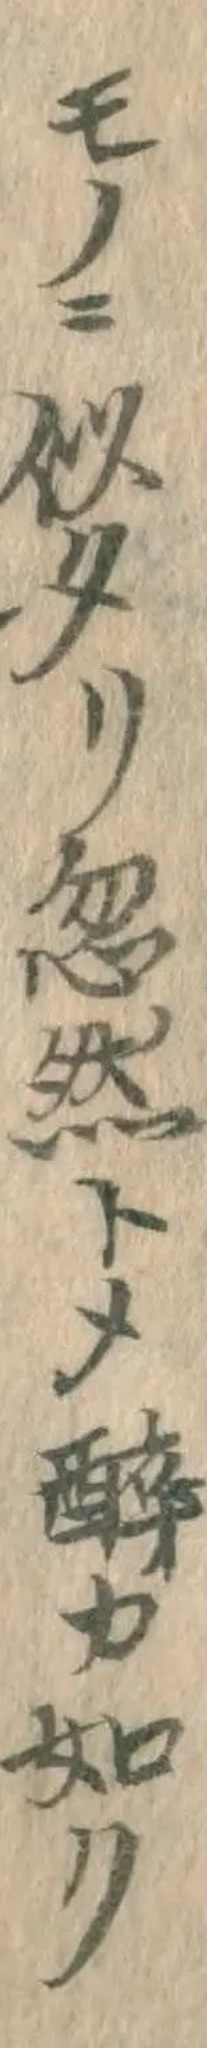モノニ似タリ忽然トシテ醉カ如ク
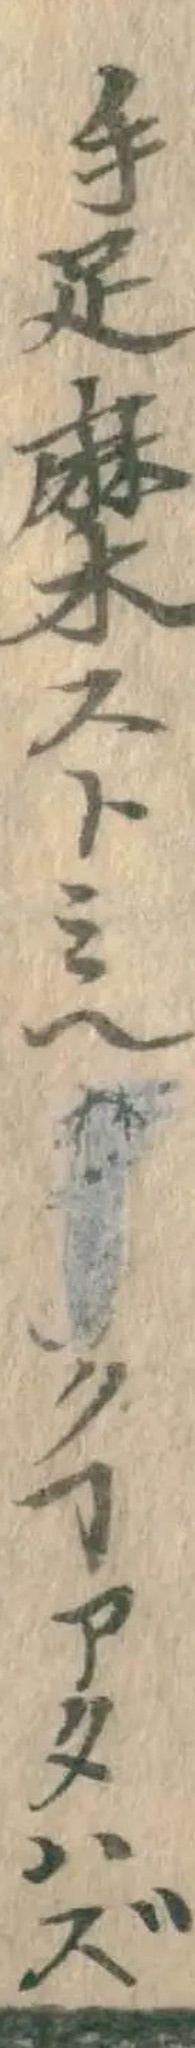手足麻木ストミヘクコトアタハズ
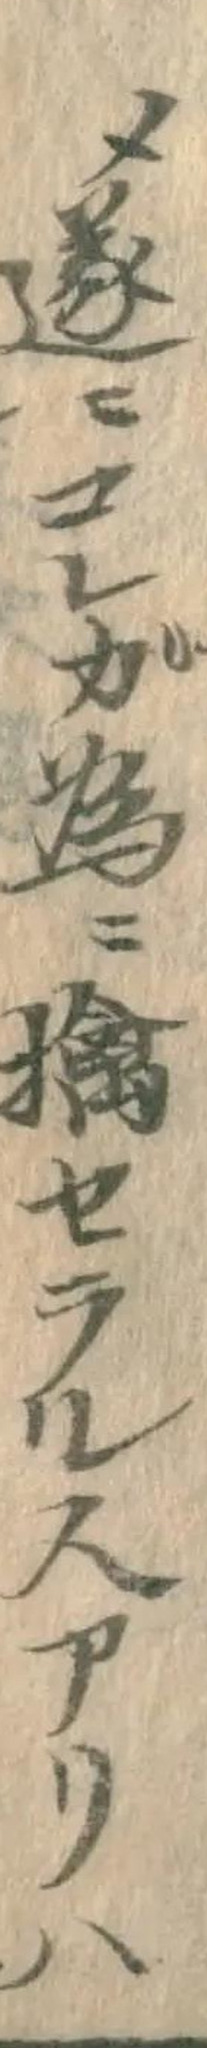シテ遂ニコレガ為ニ擒セラル人アリハ
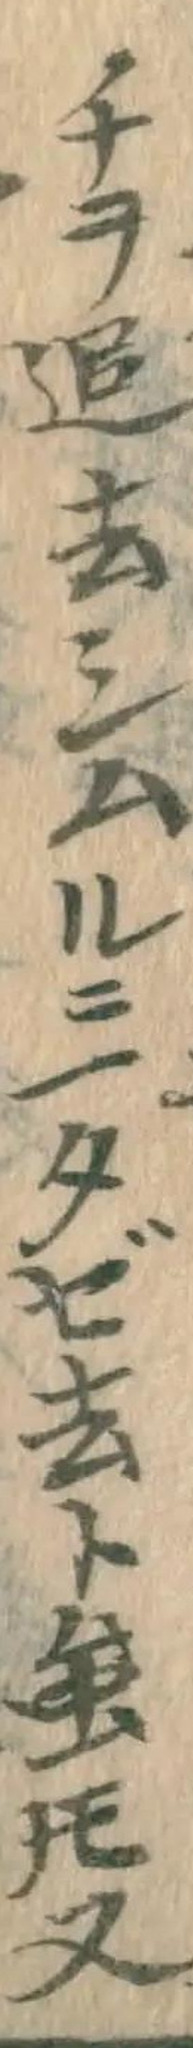チヲ退去シムルニ一タビ去ト雖トモ又
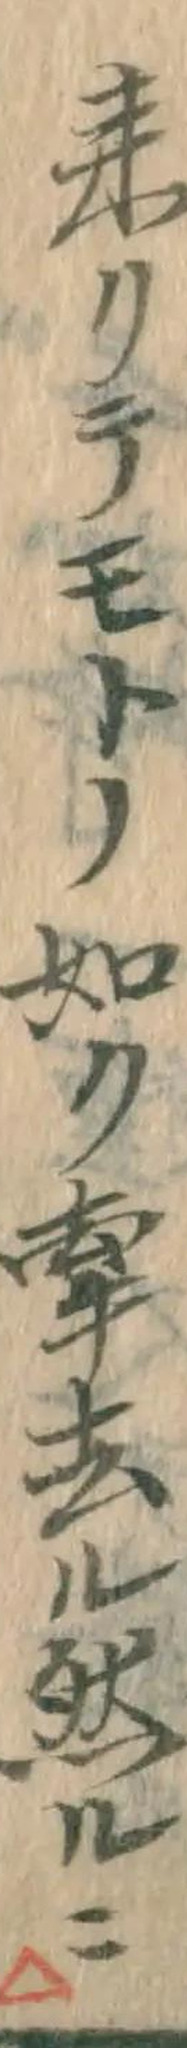来リテモトノ如ク牽去ル然ルニ

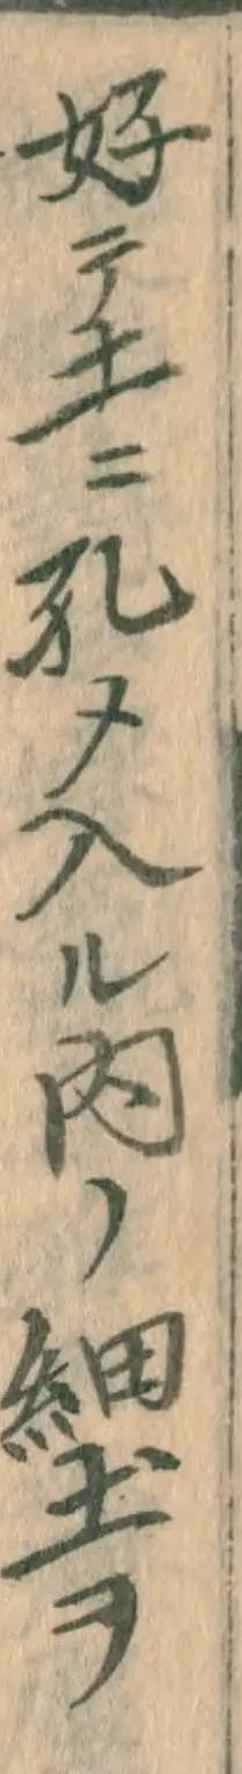好テ土ニ孔シテ入ル内ノ細𡈽ヲ
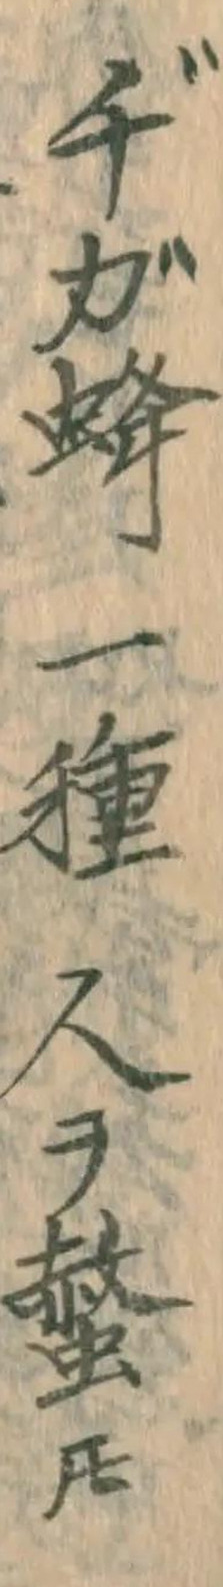ヂガ蜂一種人ヲ螫トモ
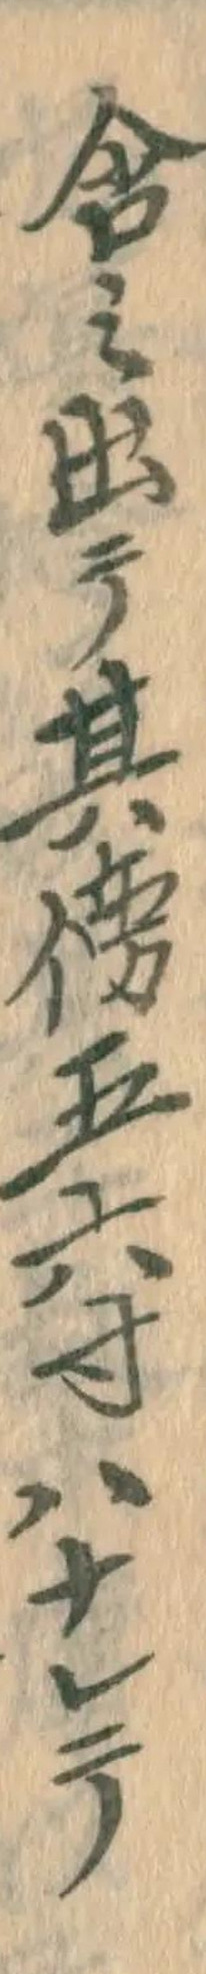含ミ出テ其傍五六寸ハナレテ
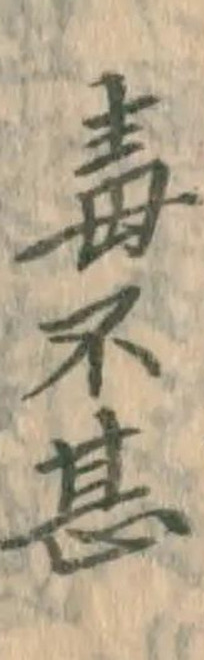毒不甚
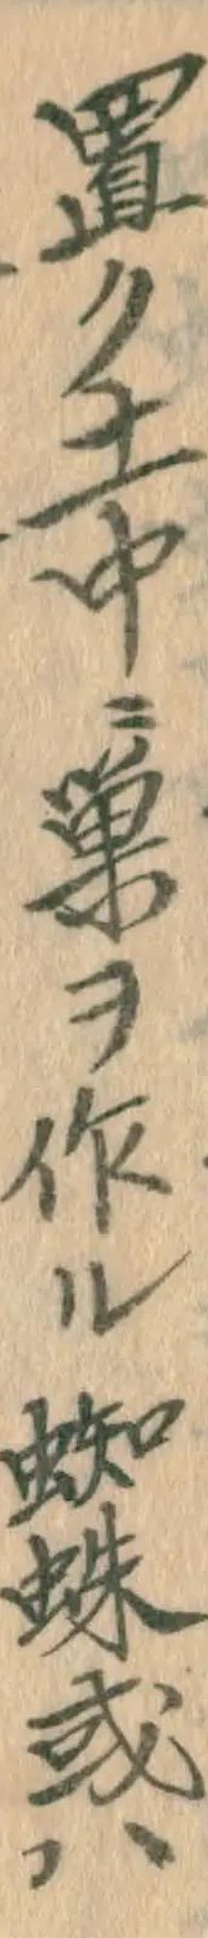置ク土中ニ巣ヲ作ル蜘蛛或ハ
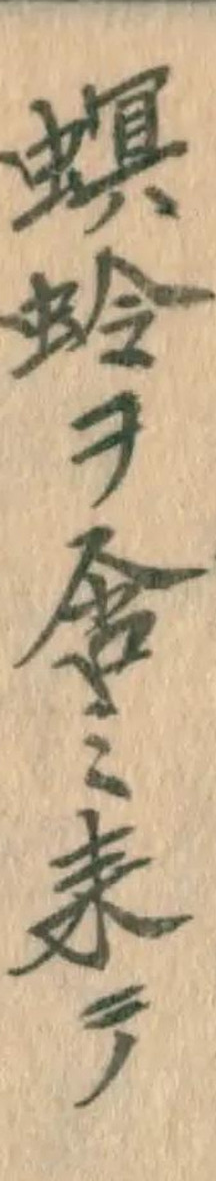螟蛉ヲ含ミ来テ
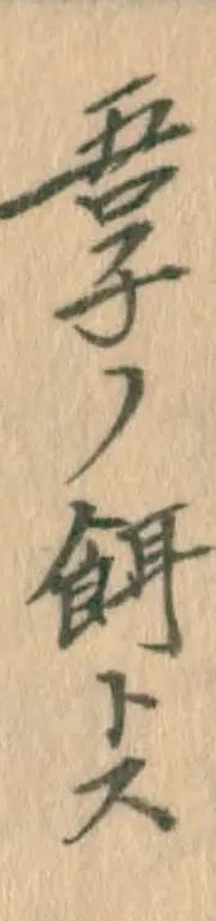吾子ノ餌トス
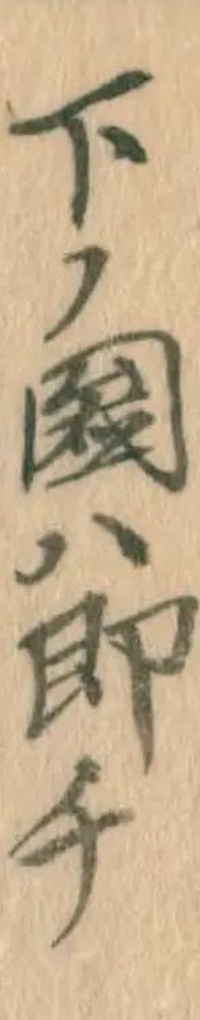下ノ圖ハ即テ
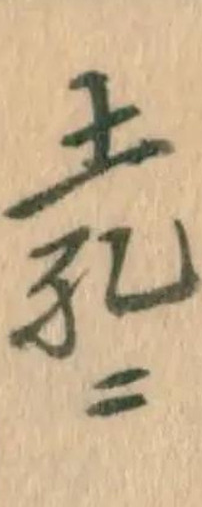土孔ニ
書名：千蟲譜 3巻. [2]
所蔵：国立国会図書館 National Diet Library, JAPAN
